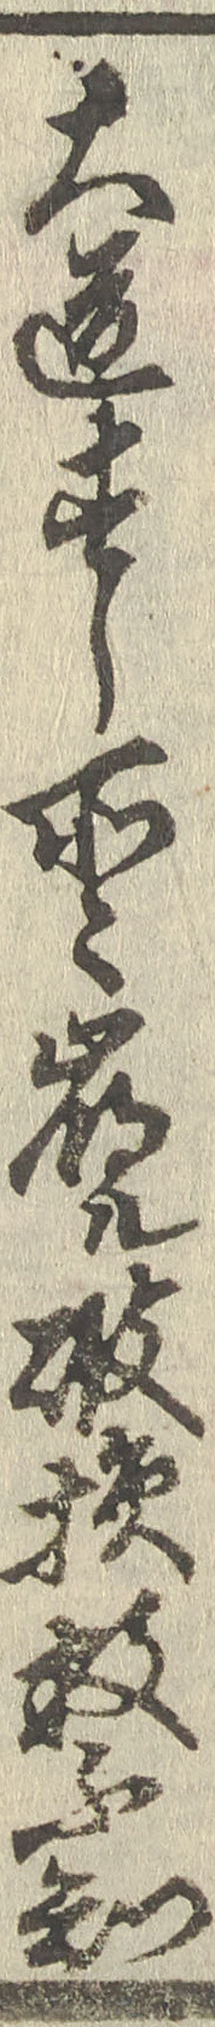大道すし所々崩ル破損数不知
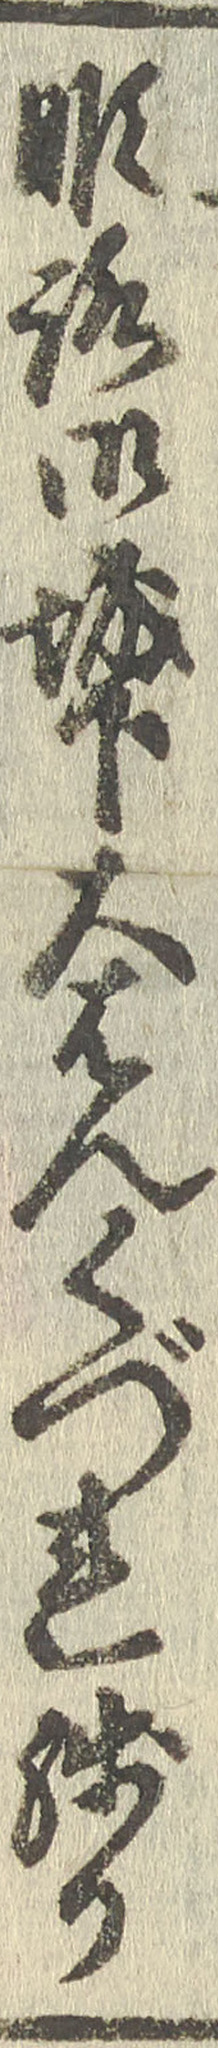姫路御城下大はんくづれ残り
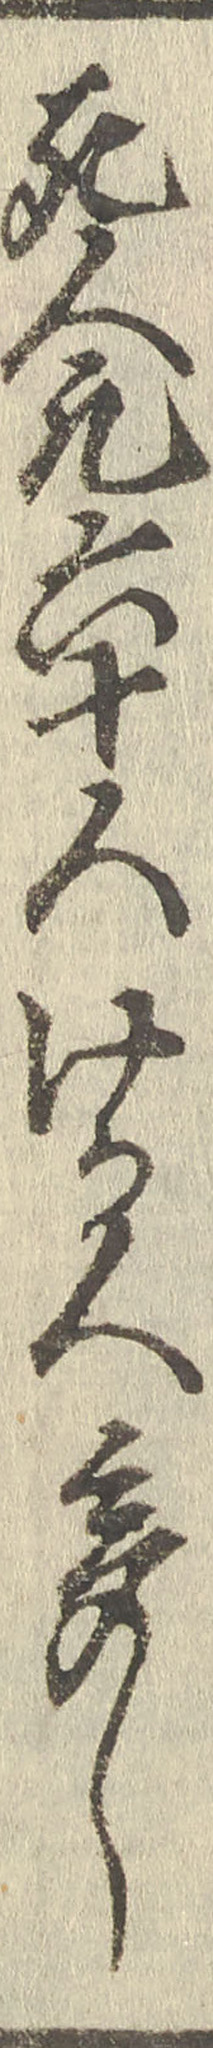死人凡六十人けか人多し
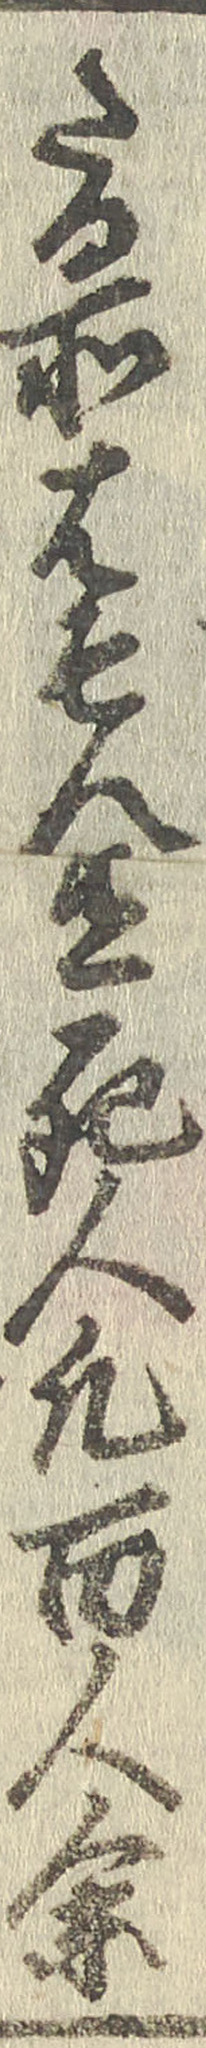たる所はそん有死人凡百人余
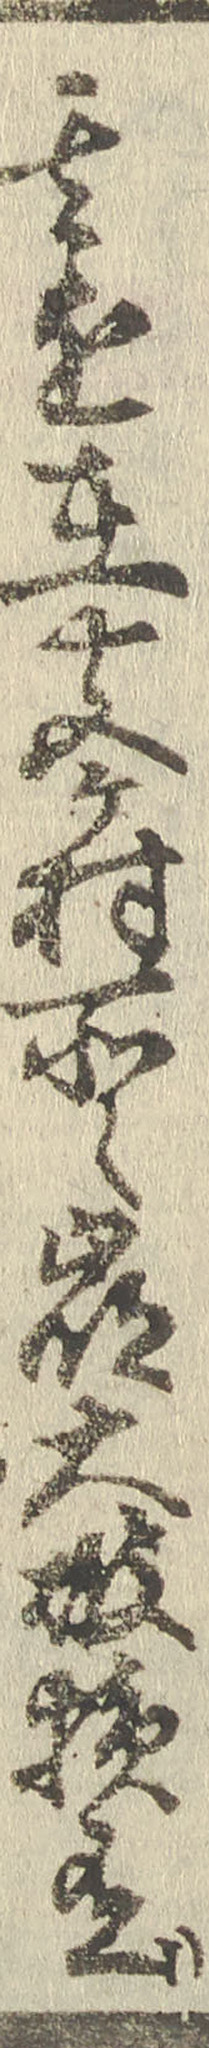其近在十五ケ村所々崩大破損有り
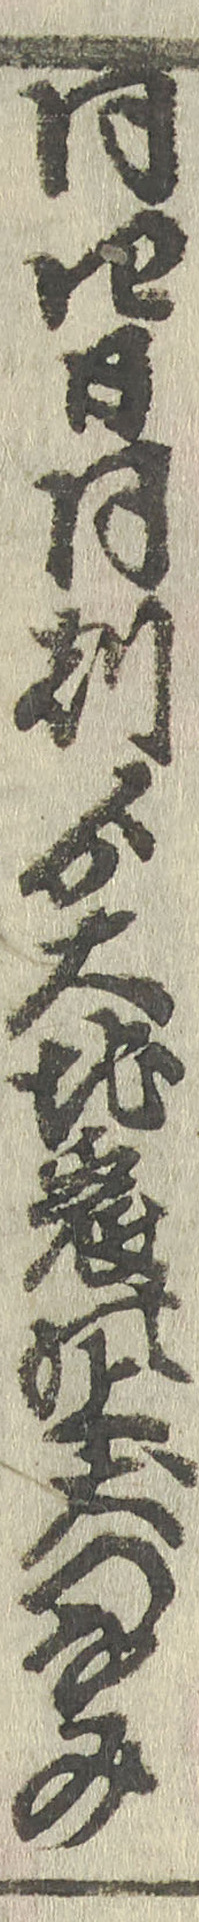同四日同刻ゟ大地震の上大つなみ
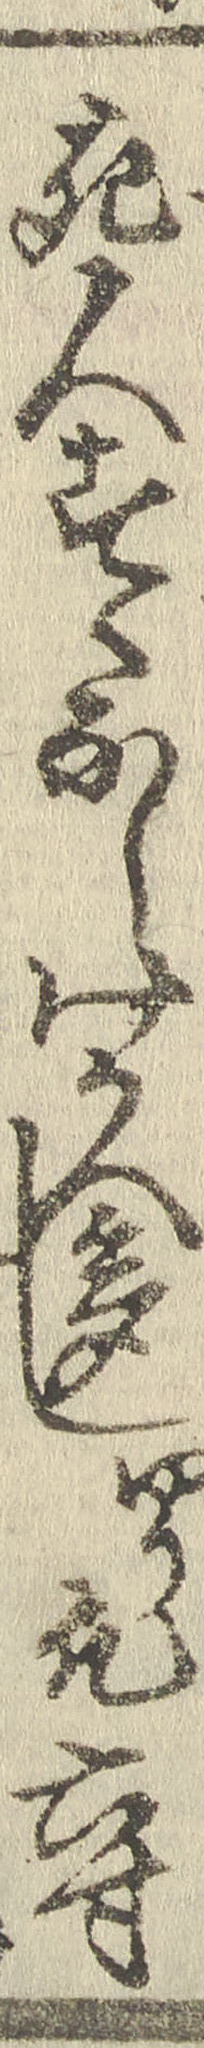死人すくなしけか人多しゆり凡六寸
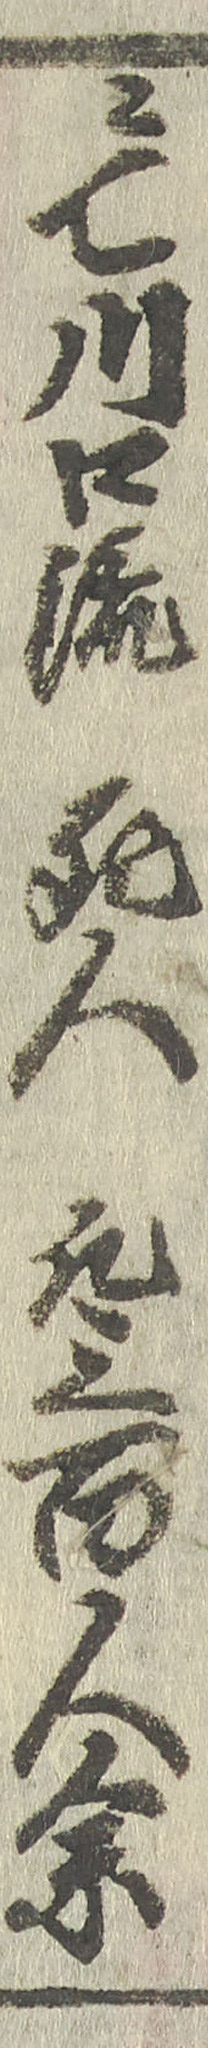にて川口流死人凡三百人余
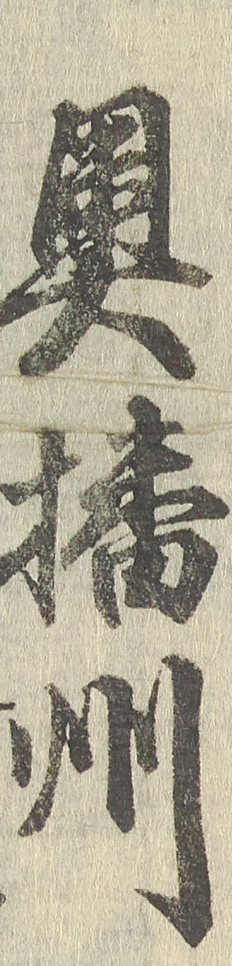奥播州
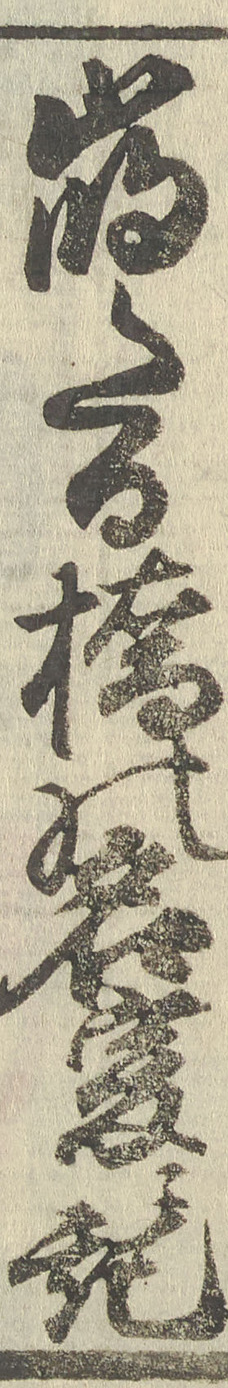崩たる橋の名爰に記
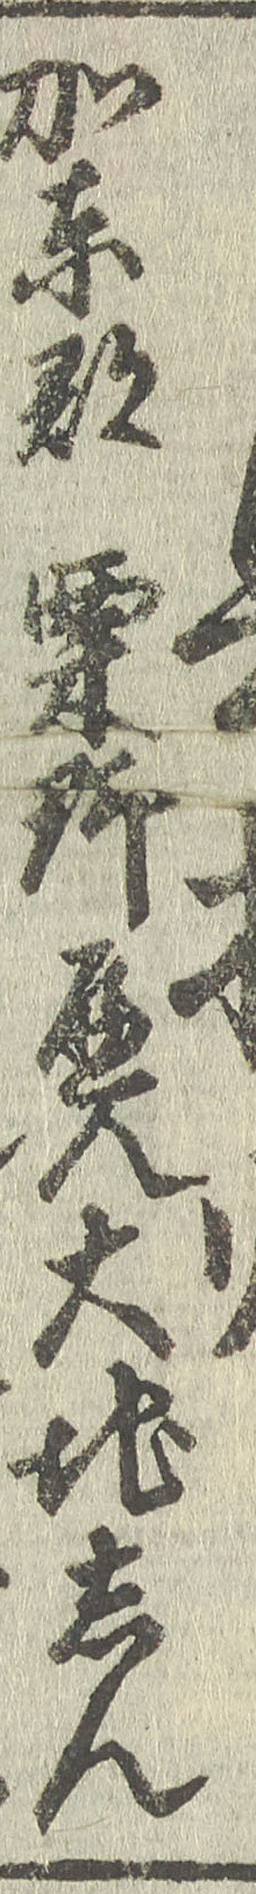加東郡栗野へん大地しん
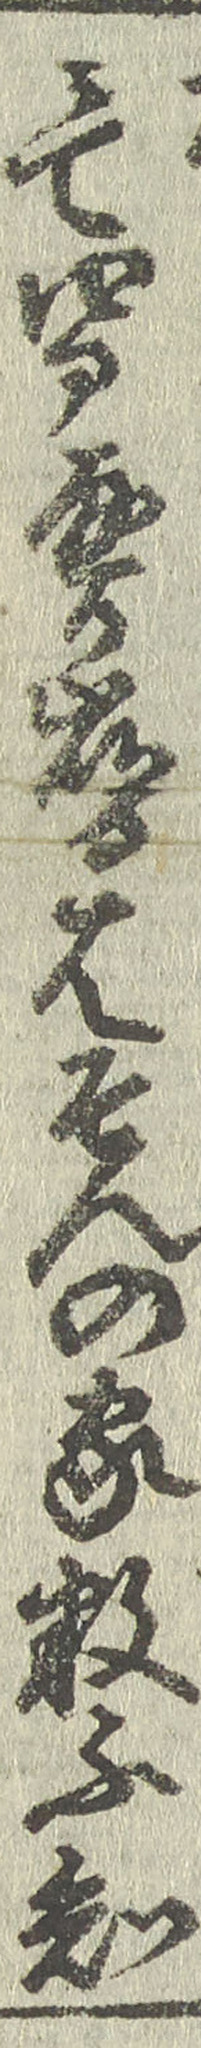にて四部通り崩るはそんの家数不知
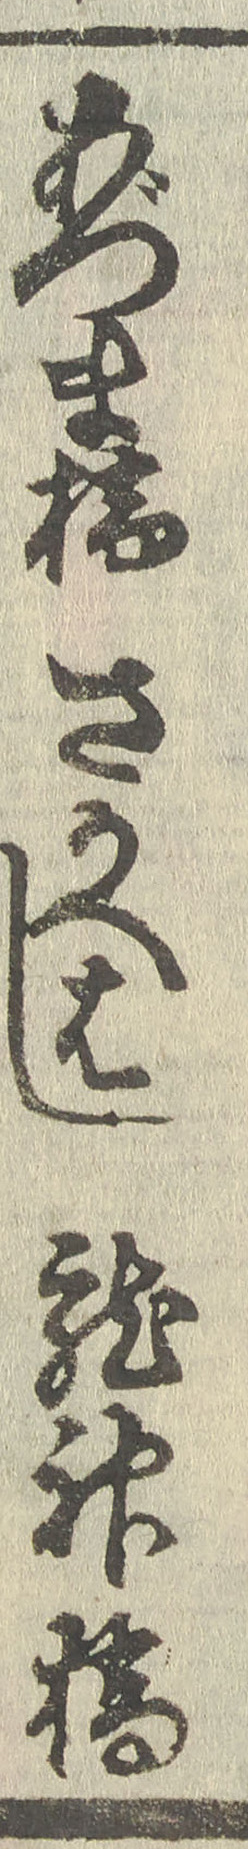あづま橋さかへはし龍神橋
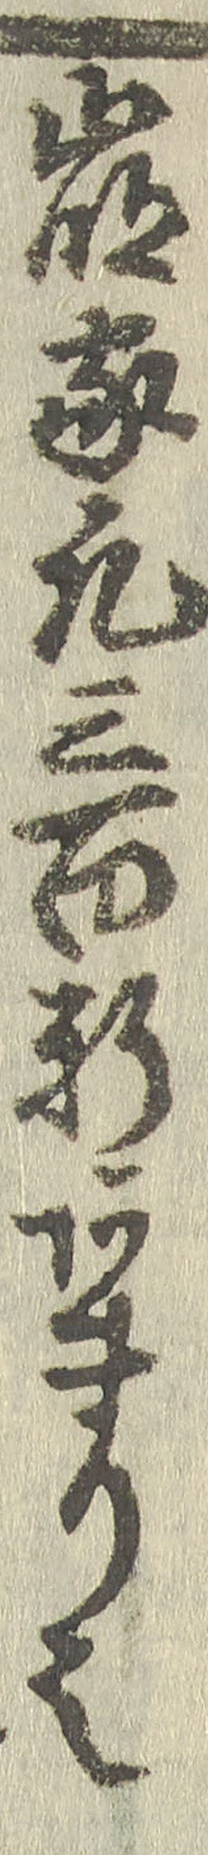崩家凡三百軒あまり也
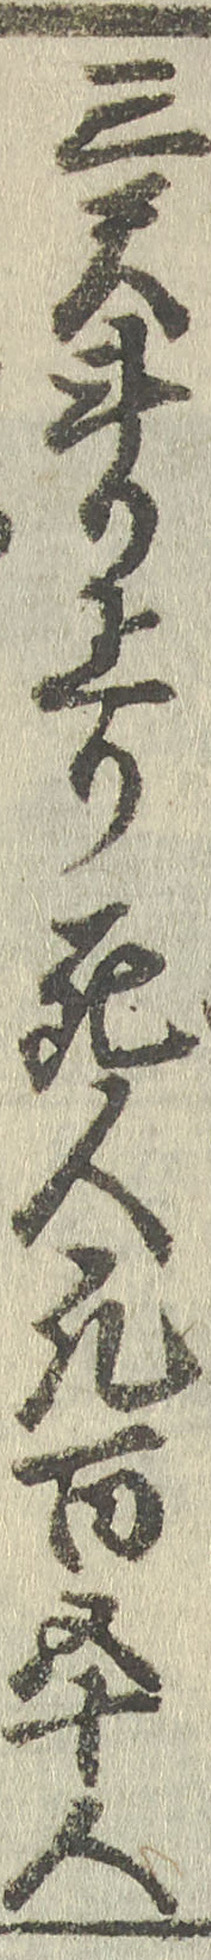三尺斗り上り死人凡百五十人
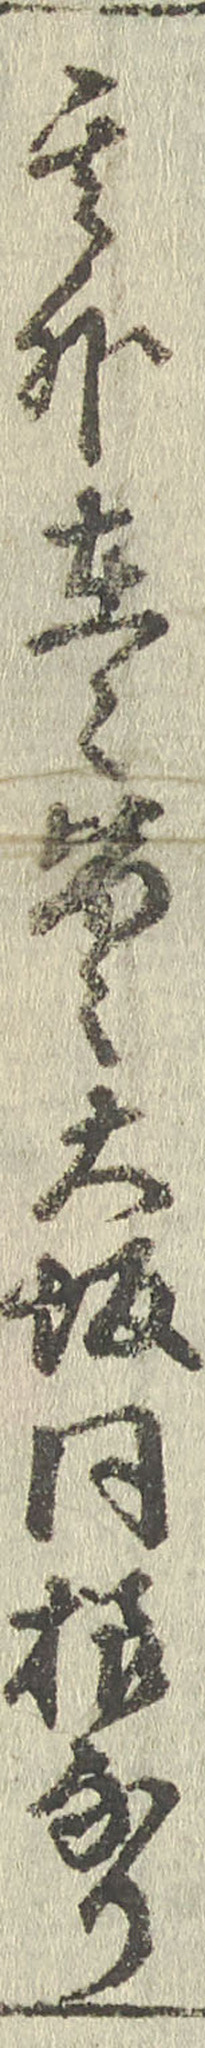其外在々皆々大坂同様なり
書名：聞書東海道南海道国々大地震大つなミ
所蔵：東京大学総合図書館 General Library in the University of Tokyo, JAPAN
